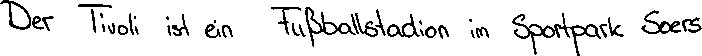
Der Tivoli ist ein Fußballstadion im Sportpark Soers
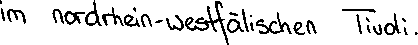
im nordrhein-westfälischen Tivoli
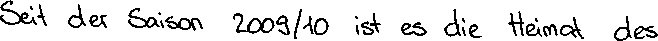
Seit der Saison 2009/10 ist es die Heimat des
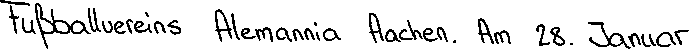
Fußballvereins Alemannia Aachen. Am 28. Januar
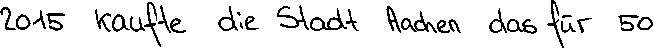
2015 kaufte die Stadt Aachen das für 50
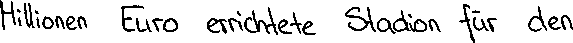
Millionen Euro errichtete Stadion für den
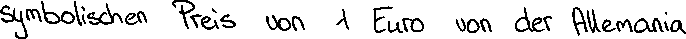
symbolischen Preis von 1 Euro von der Alemannia
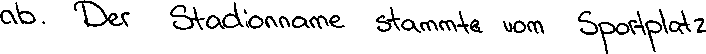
ab.Der Stadionname stammt vom Sportplatz
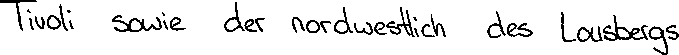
Tivoli sowie der nordwestlich des Lousbergs
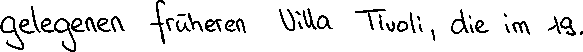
gelegenen früheren Villa Tivoli, die im 19.
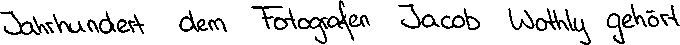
Jahrhundert dem Fotografen Jacob Wothly gehört
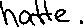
hatte.
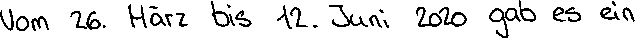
Vom 26. März bis 12. Juni 2020 gab es ein
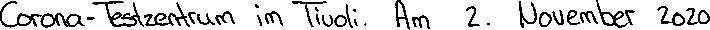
Corona-Testzentrum im Tivoli. Am 2. November 2020
